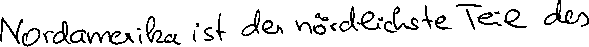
Nordamerika ist der nördliche Teil des
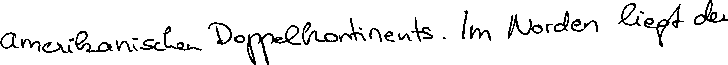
amerikanischen Doppelkontinentes. Im Norden liegt der
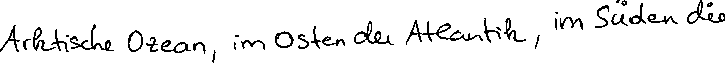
Arktische Ozean, im Osten der Atlantik, im Süden die
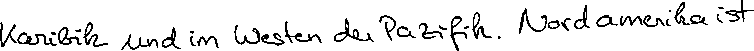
Karibik und im Westen der Pazifik. Nordamerika ist
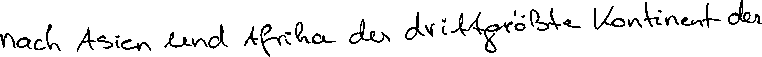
nach Asien und Afrika der drittgrößte Kontinent der
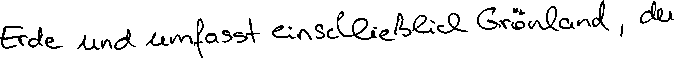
Erde und umfasst einschließlich Grönland, der
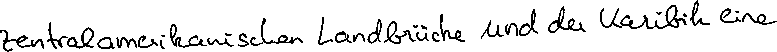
zentralamerikanischen Landbrücke und der Karibik eine
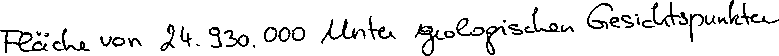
Fläche von 24.930.000 Unter geologischen Gesichtspunkten
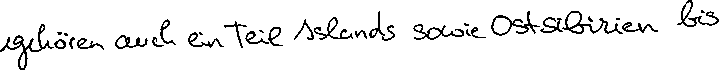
gehören auch ein Teil Islands sowie Ostsibirien bis
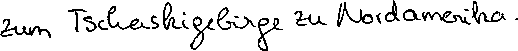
zum Tscherskigebirge zu Nordamerika.
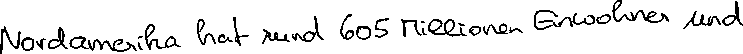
Nordamerika hat rund 605 Millionen Einwohner und
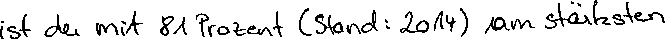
ist der mit 81 Prozent (Stand: 2014) am stärksten
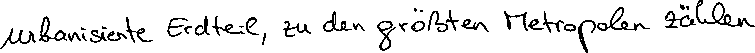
urbanisierte Erdteil, zu den größten Metropolen
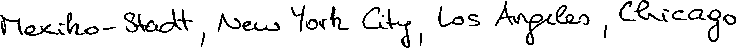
Mexiko-Stadt, New York City, Los Angeles, Chicago
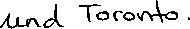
und Toronto.
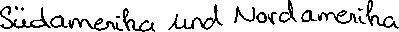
Südamerika und Nordamerika
